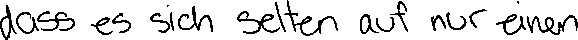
dass es sich selten auf nur einen
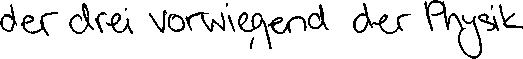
der drei vorwiegend der Physik
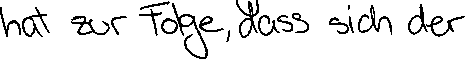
hat zur Folge, dass sich der
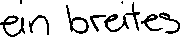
ein breites
